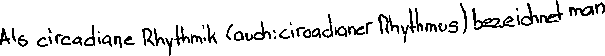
Als circadiane Rhythmik (auch: circadianer Rhythmus) bezeichnet man
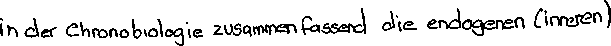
in der Chronobiologie zusammenfassend die endogenen (inneren)
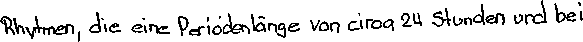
Rhythmen, die eine Periodenlänge von circa 24 Stunden und bei
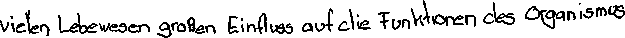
vielen Lebewesen großen Einfluss auf die Funktionen des Organismus
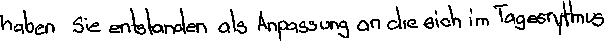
haben. Sie entstanden als Anpassung an die sich im Tagesrhythmus
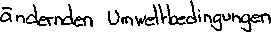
ändernden Umweltbedingungen.
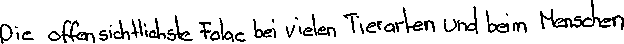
Die offensichtlichste Folge bei vielen Tierarten und beim Menschen
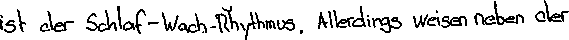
ist der Schlaf-Wach-Rhythmus. Allerdings weisen neben der
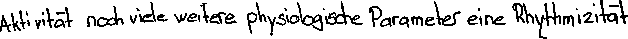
Aktivität noch viele weitere physiologische Parameter eine Rhythmizität
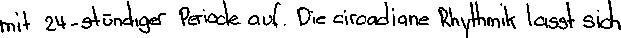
mit 24-stündiger Periode auf. Die circadiane Rhythmik lässt sich
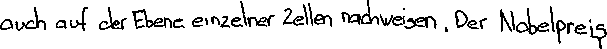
auch auf der Ebene einzelner Zellen nachweisen. Der Nobelpreis
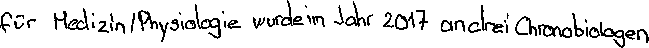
für Medizin/Physiologie wurde im Jahr 2017 an drei Chronobiologen
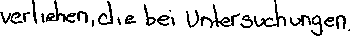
verliehen, die bei Untersuchungen
